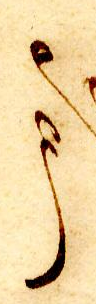To
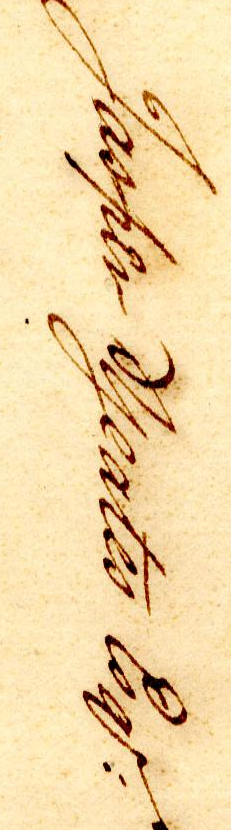Jasper Yeates Esq^r.
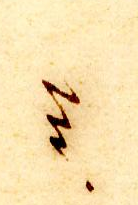in
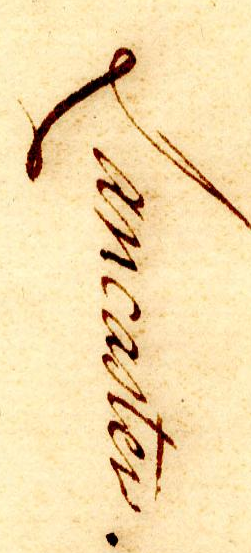Lancaster
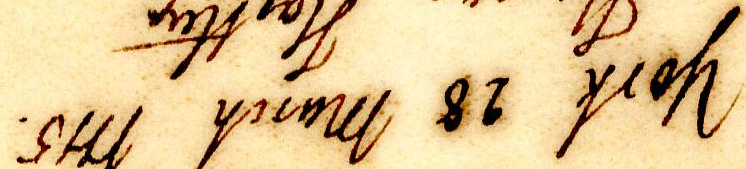York 28 March 1775.
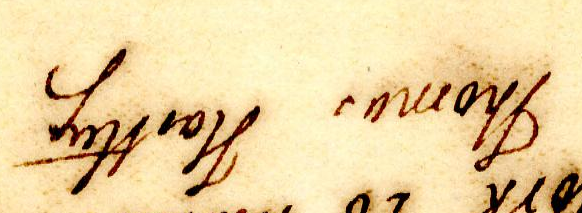Thomas Hartley
